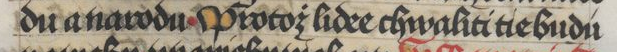du a narodu.Protoż lidee chwaliti tíe budú
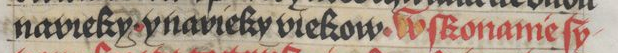navieky.y navieky viekow.Wſkonanie ſy¬
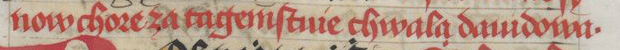now chore za tagemſtuie chwala dauidowa.
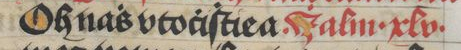Oh naṡ vtoċiẛtiea.Żalm.xlv.
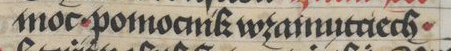moc.pomocník wzamutciech.
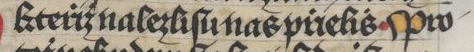kteṙíż nalezli ſu nas pṙíeliṡ.Pro¬
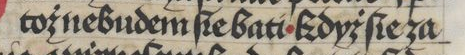toż nebudem ſie bati.kdyż ſie za
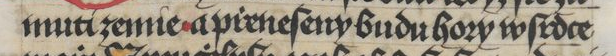mutí zemie.a pṙeneſeny budu hory w ſrdce
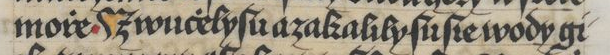moṙe.Zwuċelyſu a zakalily ſu ſie wody gí¬
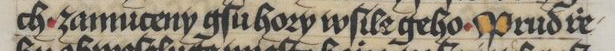ch.zamuceny gſu hory wſile geho.Prud ṙe¬
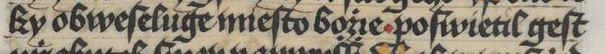ky obweſeluge mieſto bożie.poſwietil geſt
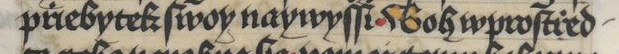pṙiebytek ſwoy naywyẛẛí.Boh wproſtṙed¬
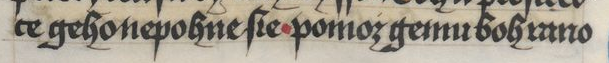ce gehonepohne ſie.pomoz gemu boh rano
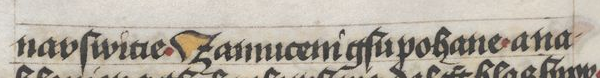navſwicie.Zamuceni gſu pohane.a na¬
